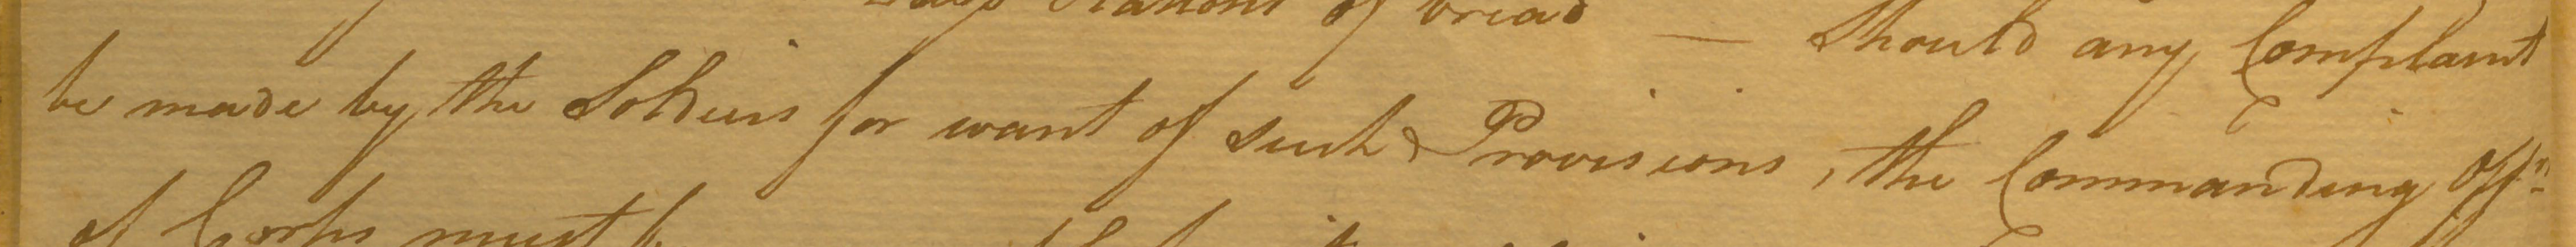be made by the Soldiers for want of such Provisions, the Commanding Off^r
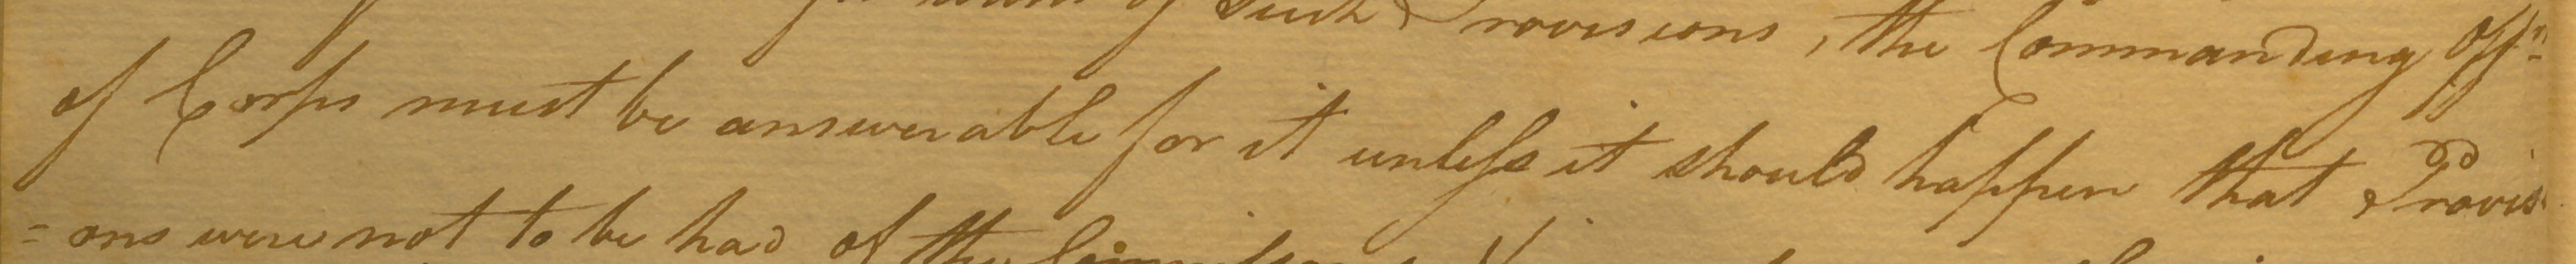of Corps must be answerable for it unless it should happen that Provis-
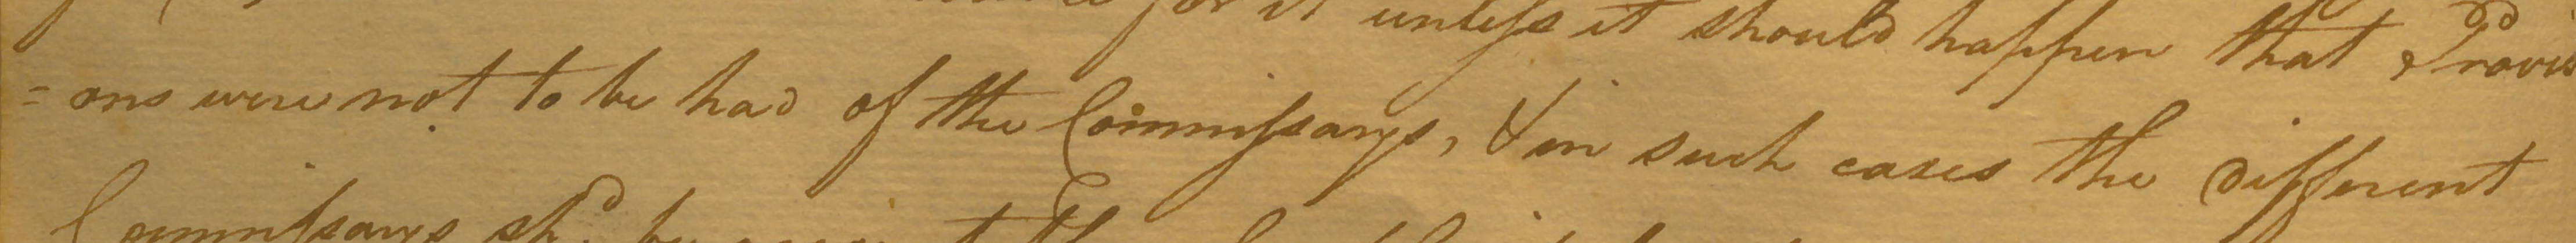-ons were not to be had of the Commissarys, & in such cases the different
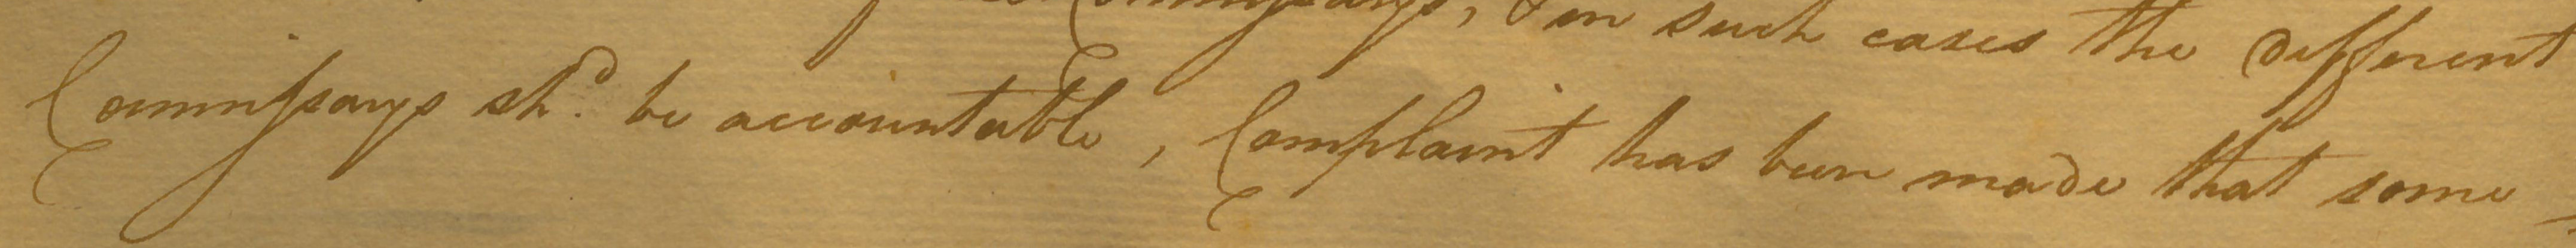Commissarys sh^d. be accountable, Complaint has been made that some
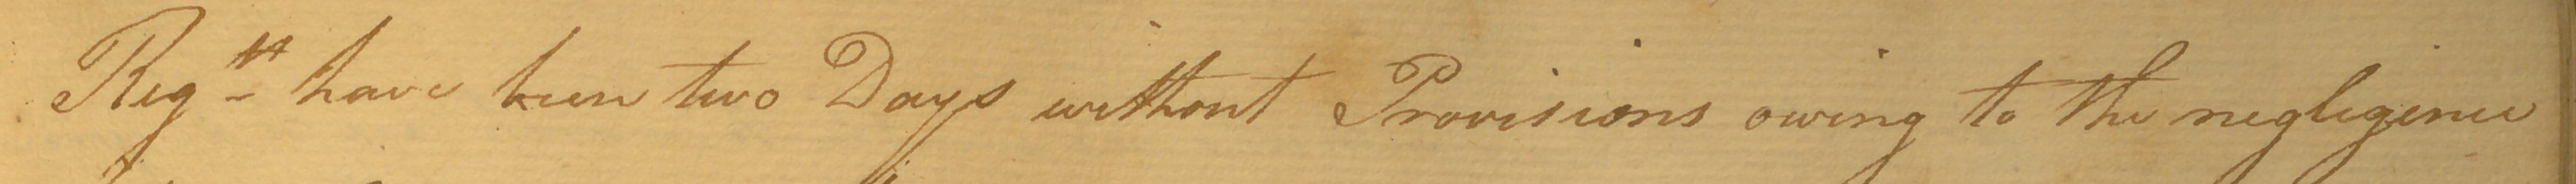Reg^ts have been two Days without Provisions owing to the negligence
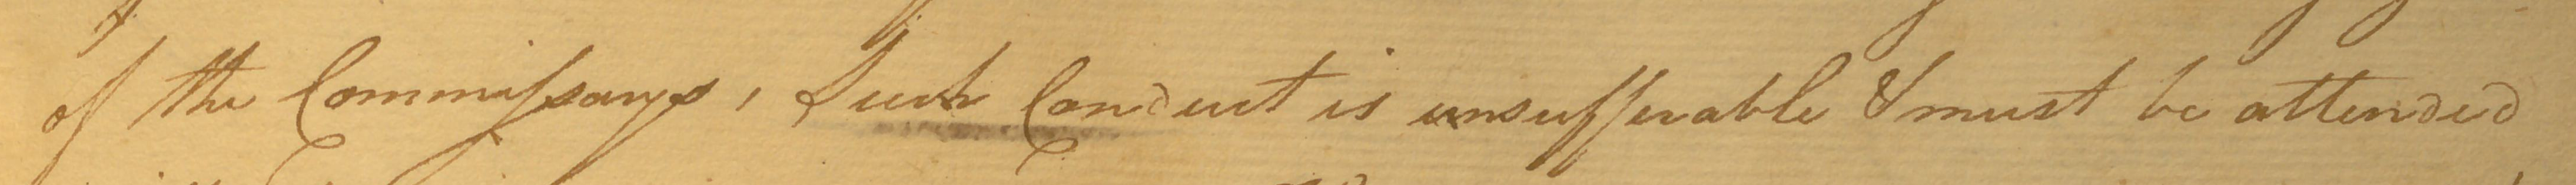of the Commissarys, Such Conduct is insufferable & must be attended
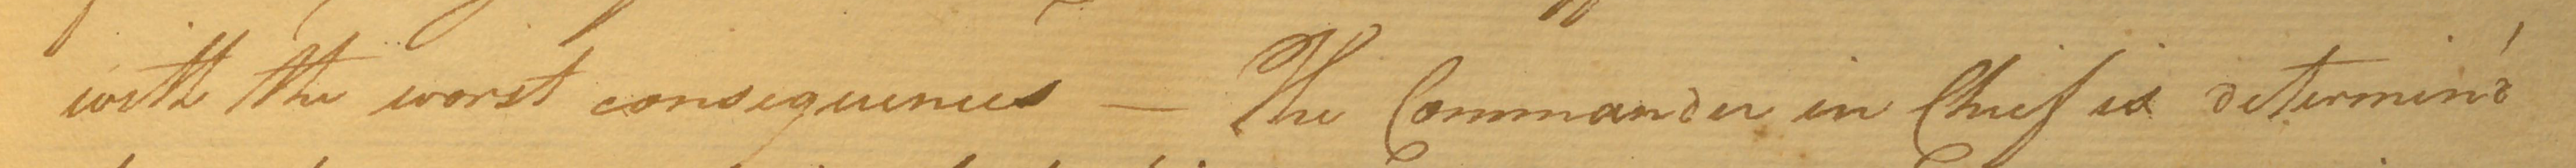with the worst consequences- The Commander in Chief is determin'd
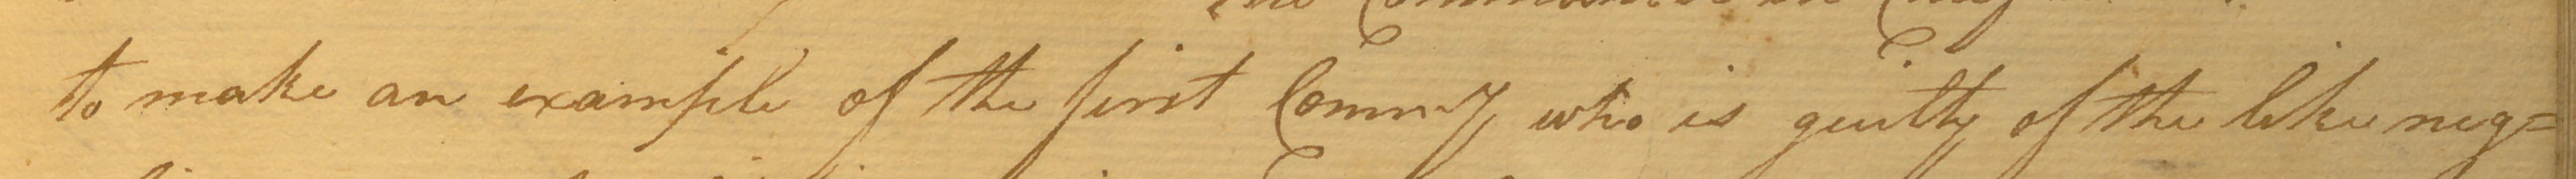to make an example of the first Comm^y who is guilty of the like neg-
